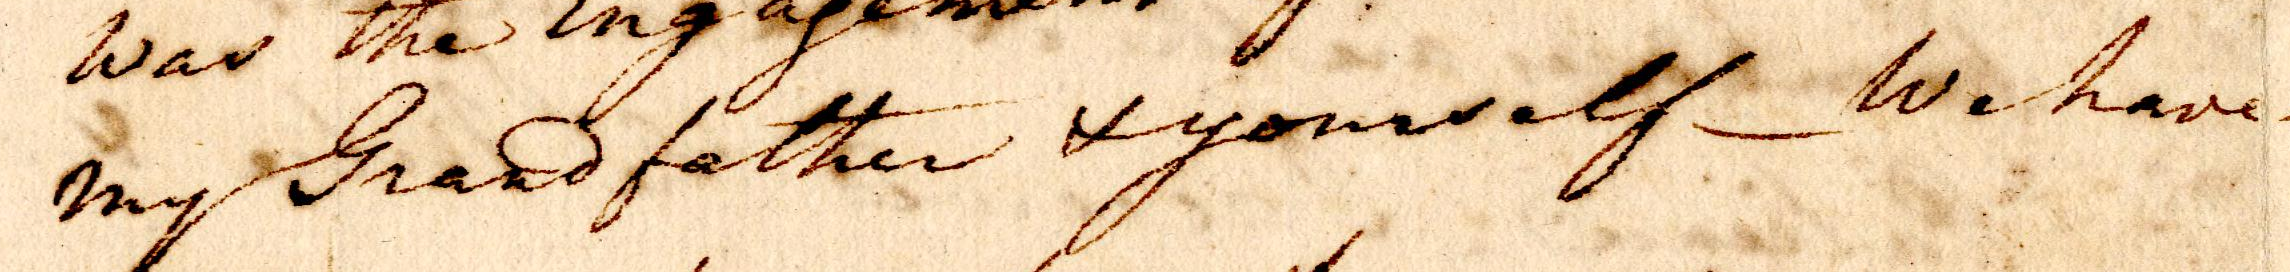my Grandfather & yourself- We have
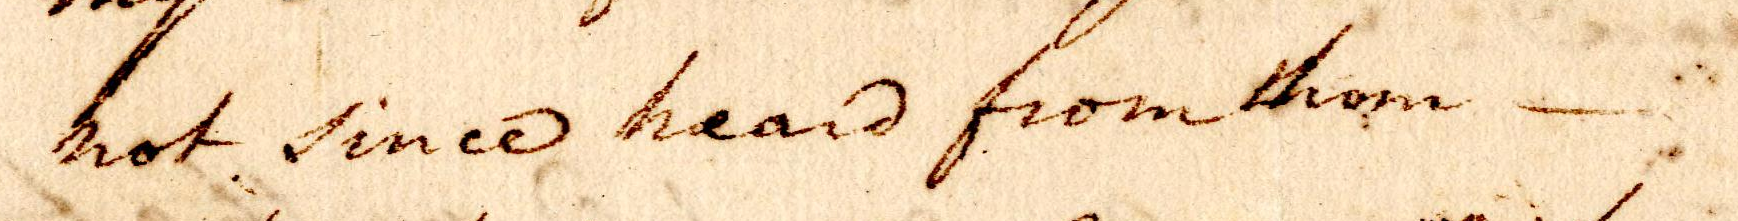not since heard from them-
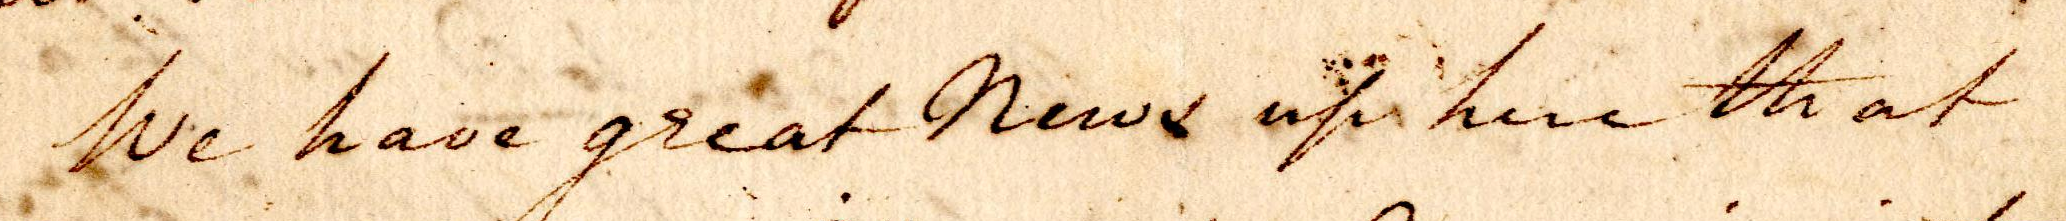We have great News up here that
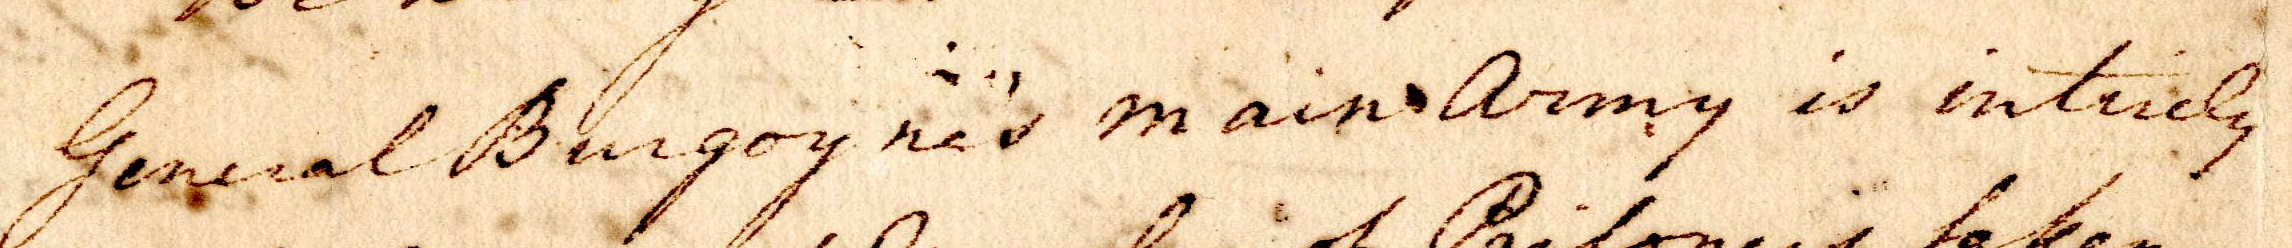General Burgoyne's main Army is intirely
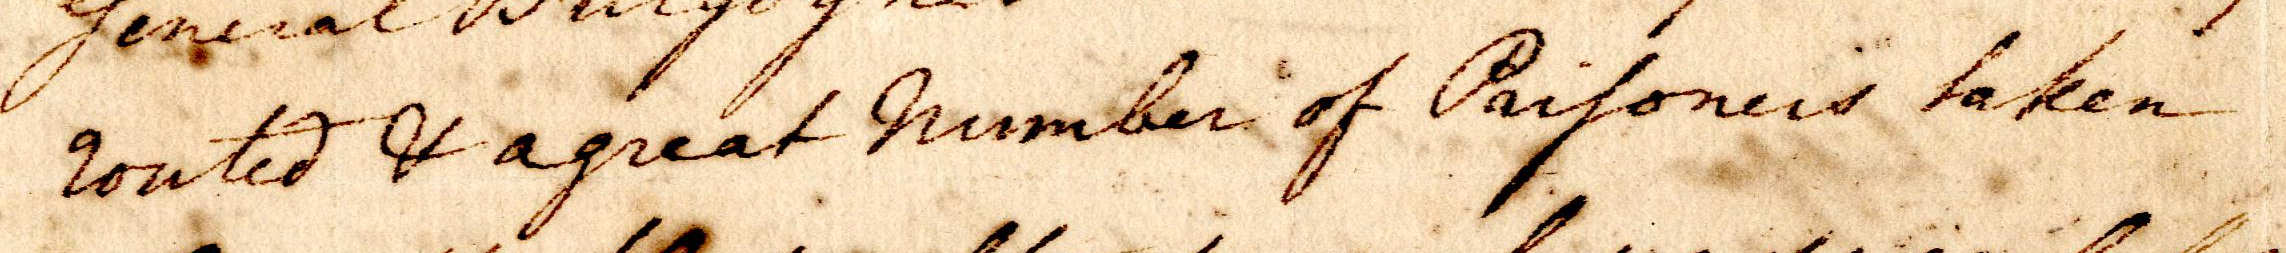routed & a great Number of Prisoners taken
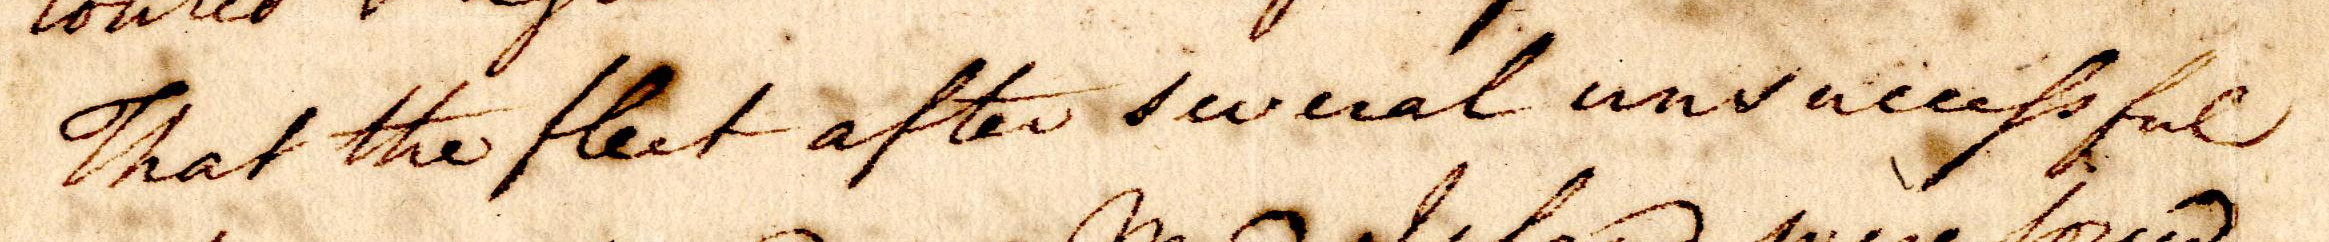That the fleet after several unsuccessful
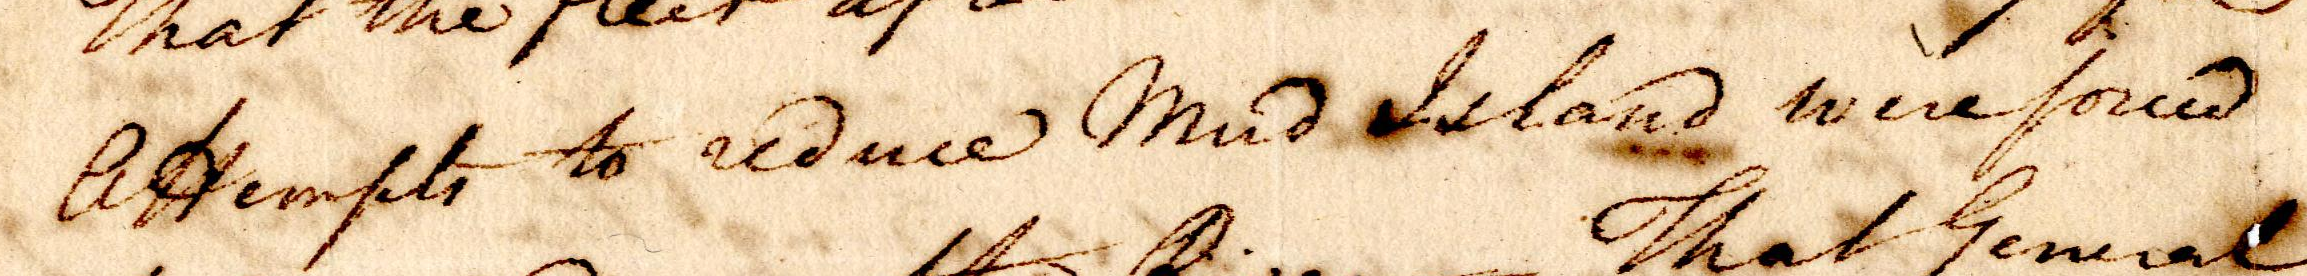Attempts to reduce Mud Island were forced
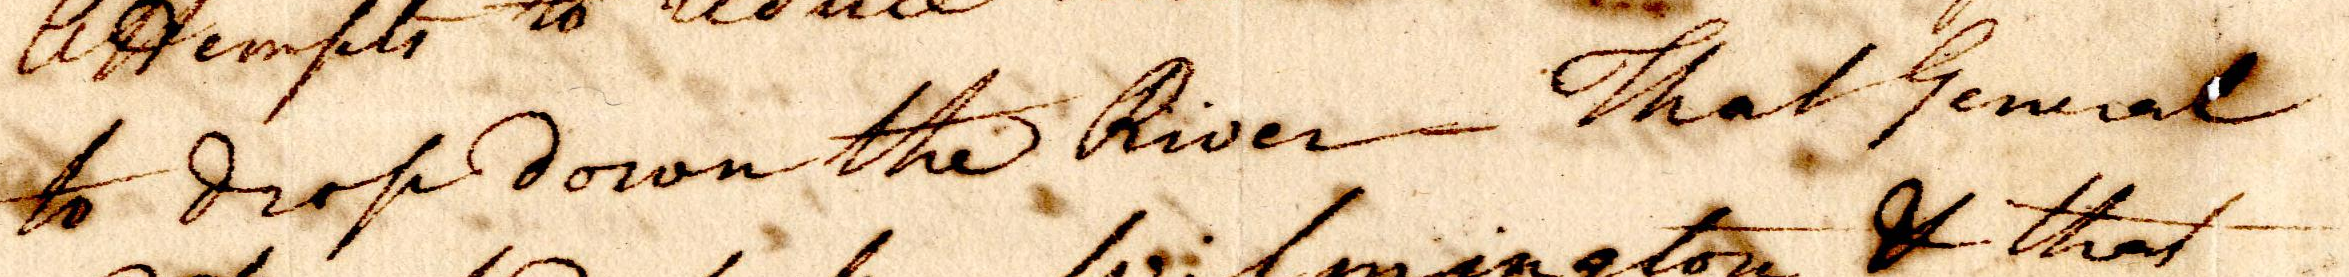to drop down the River- That General
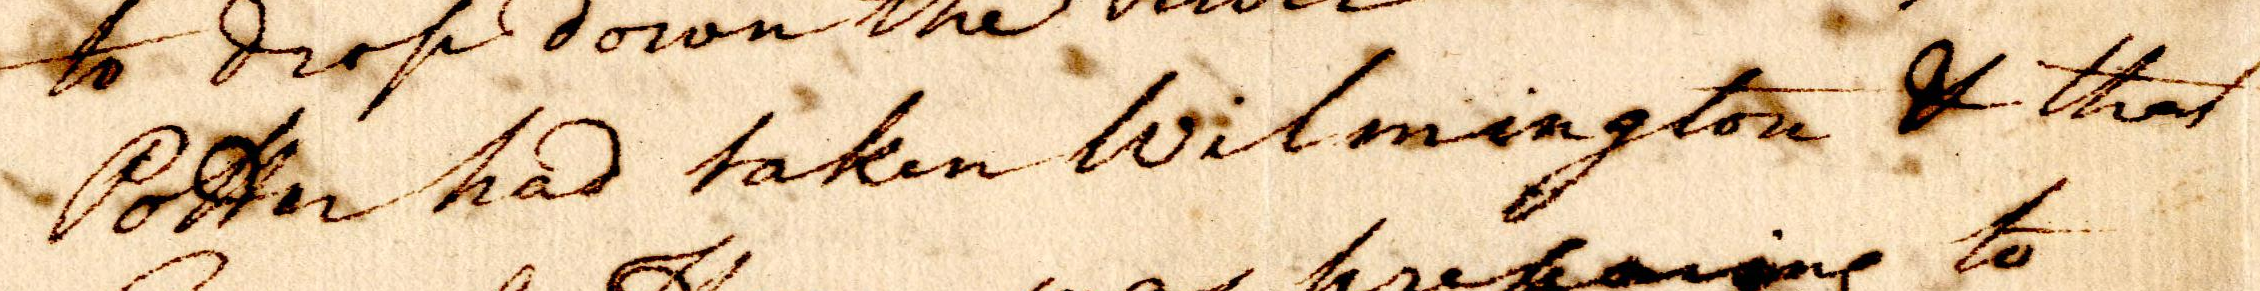Potter had taken Wilmington & that
